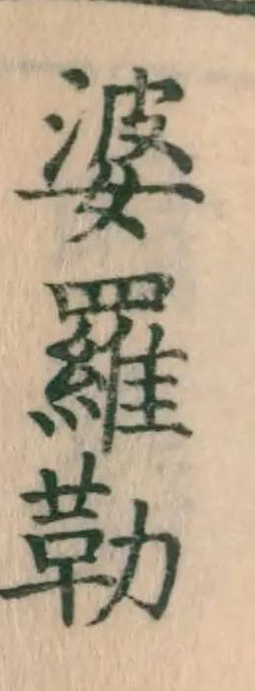婆羅勒

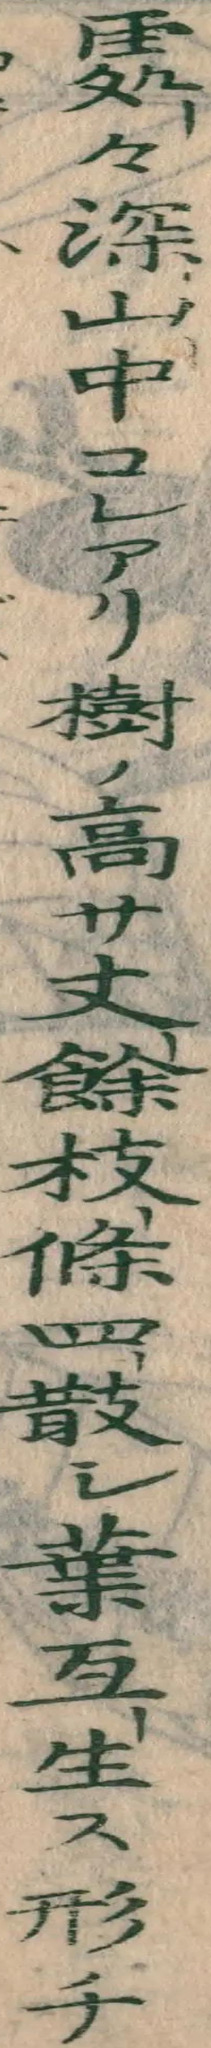処-々深-山-中コレアリ樹ノ高サ丈-余枝-条四-散シ葉互-生ス形チ
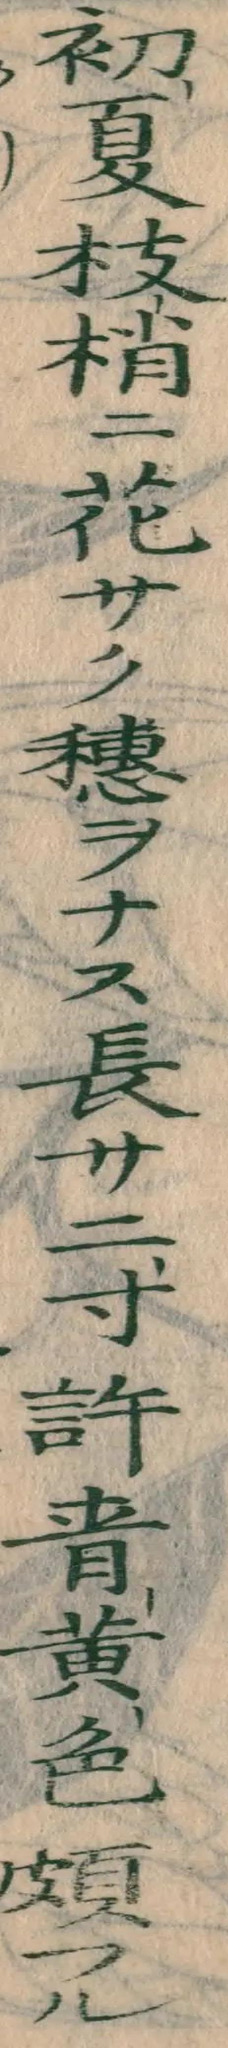初-夏枝-梢ニ花サク穂ヲナス長サ二-寸許青-黄-色頗フル
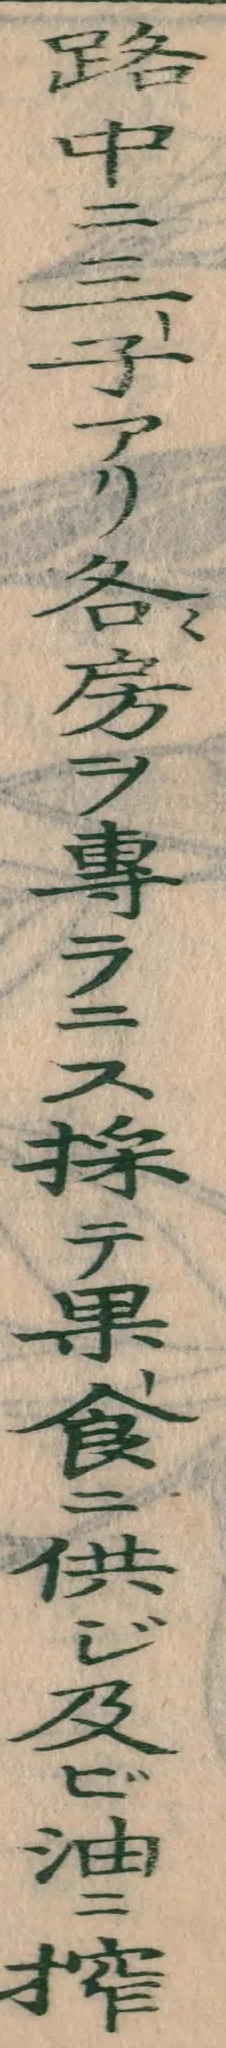路中ニ三-子アリ各〻房ヲ専ラニス採テ果-食ニ供ジ及ビ油ニ搾
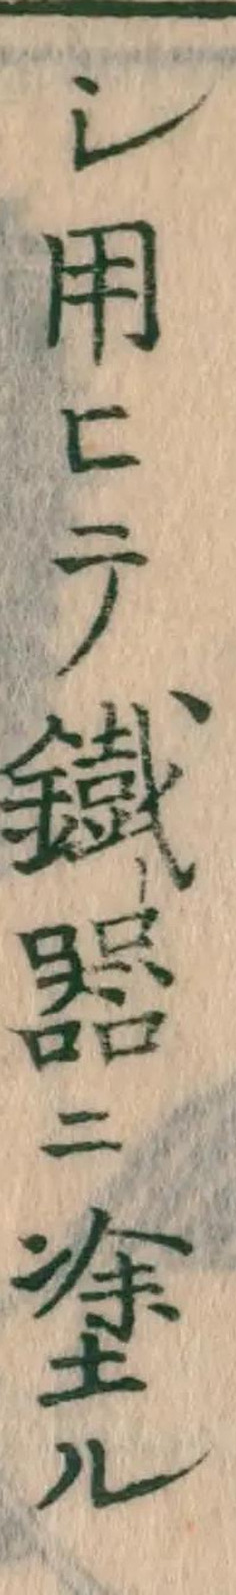シ用ヒテ鉄-器ニ塗ル

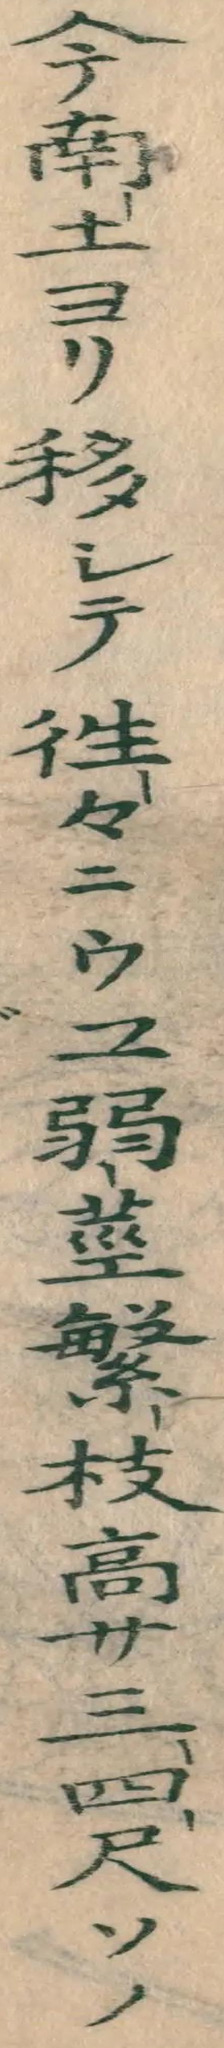今南-土ヨリ移シテ往-々ニウユ弱-茎繁-枝高サ三-四-尺ソノ
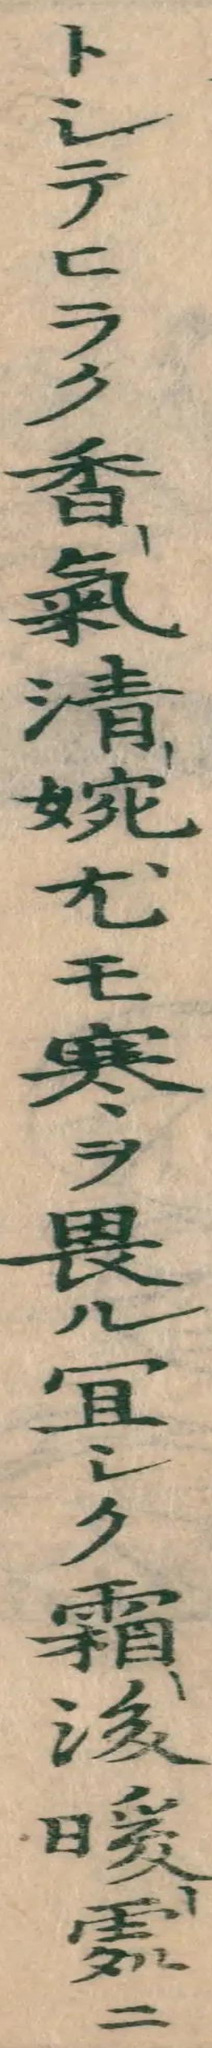トシテヒラク香-気清-婉尤モ寒ヲ畏ル宜シク霜-後暖-処ニ
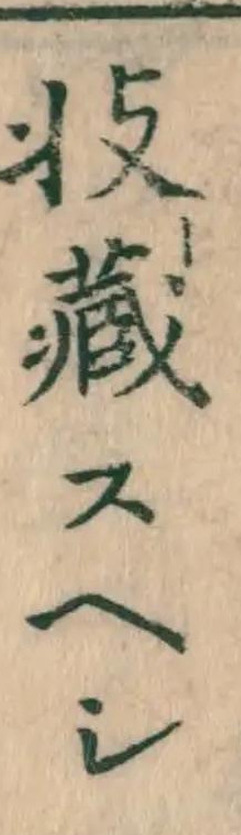収-蔵スヘシ

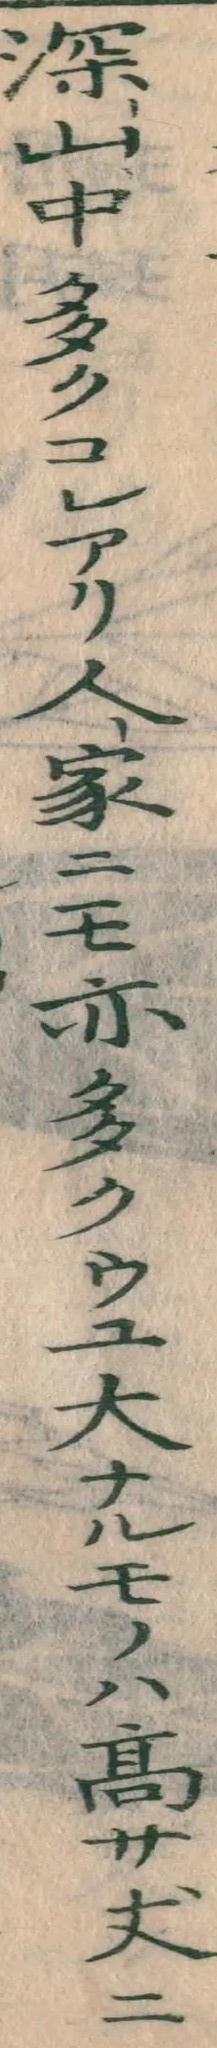深-山-中多クコレアリ人-家ニモ亦多クウユ大ナルモノハ高サ丈ニ
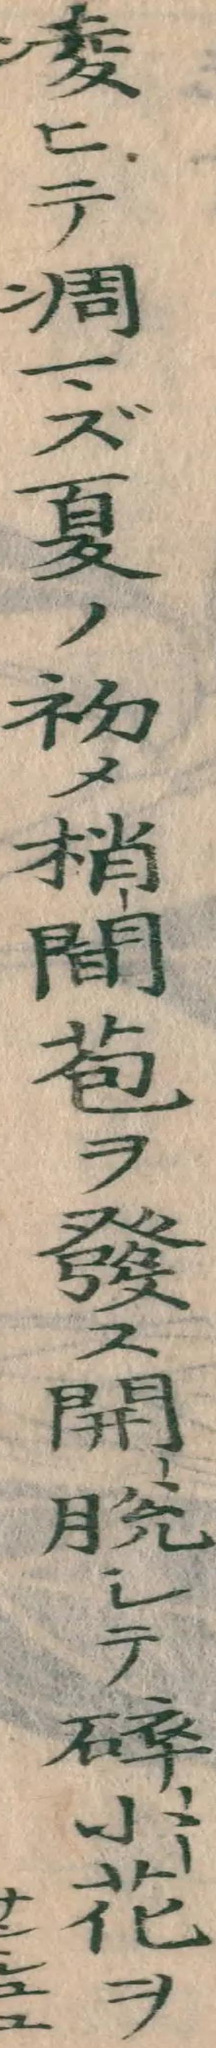凌ヒテ凋マズ夏ノ初メ梢-間苞ヲ発ス開-脱シテ砕-小-花ヲ
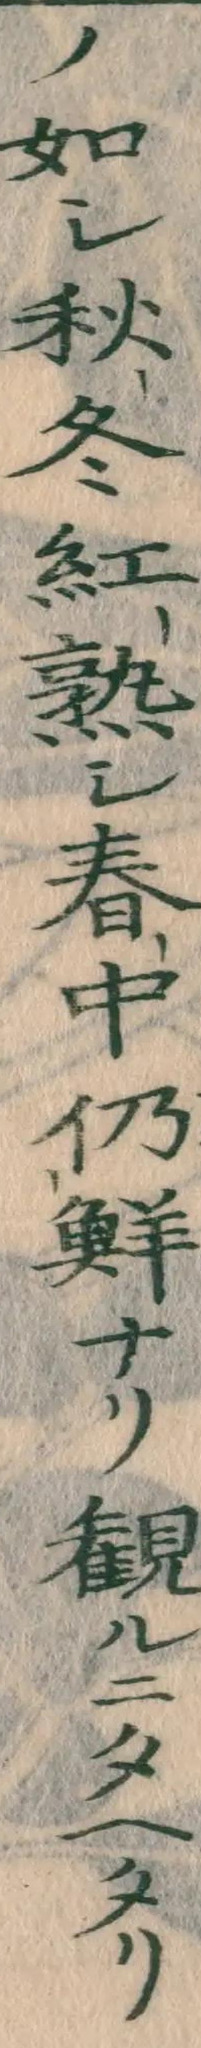ノ如シ秋-冬紅-熟シ春-中仍-鮮ナリ観ルニタヘタリ
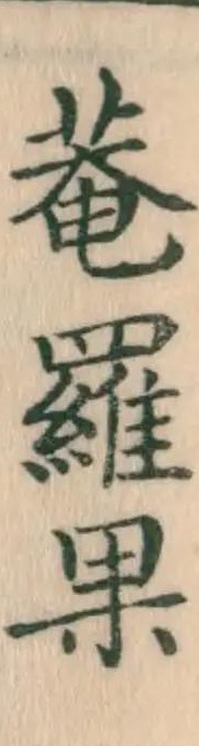菴羅果

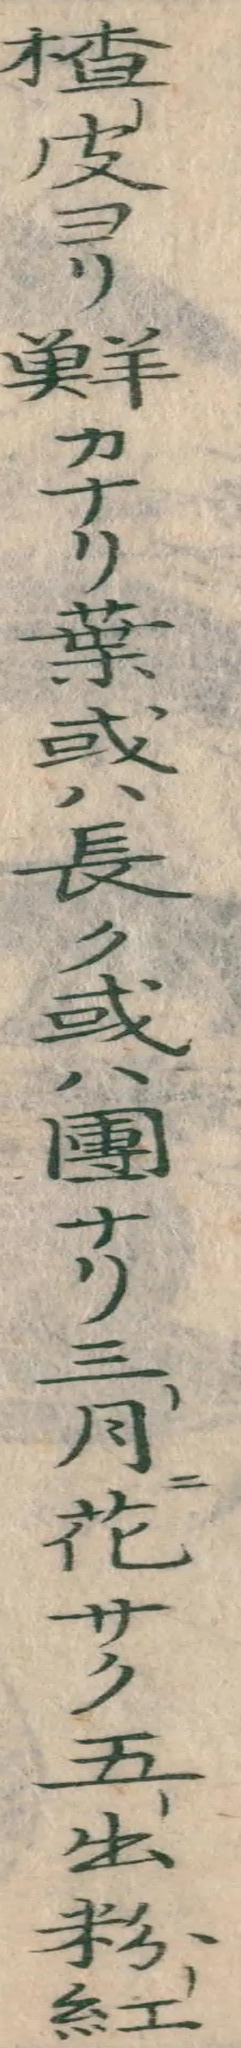楂-皮ヨリ鮮カナリ葉或ハ長ク或ハ団ナリ三-月花サク五-出粉-紅
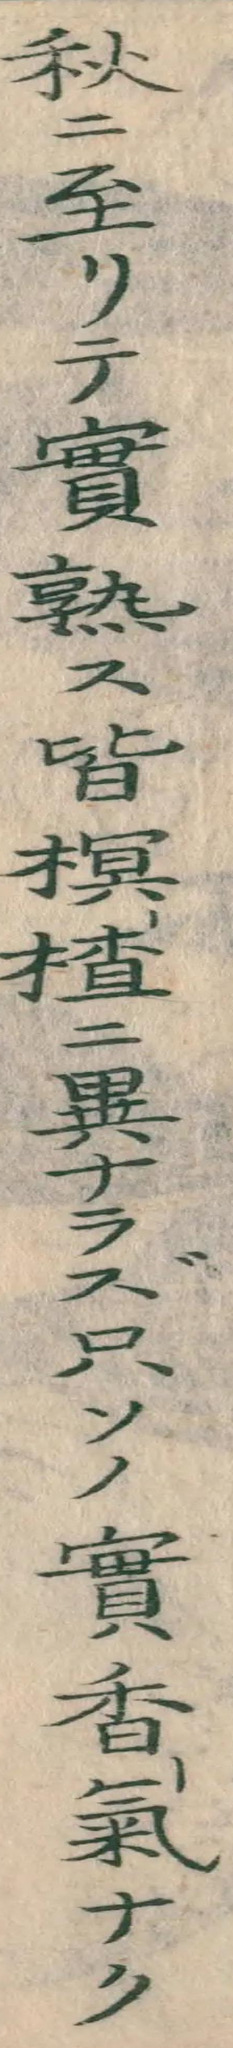秋ニ至リテ実熟ス皆榠-楂ニ異ナラズ只ソノ実香-気ナク
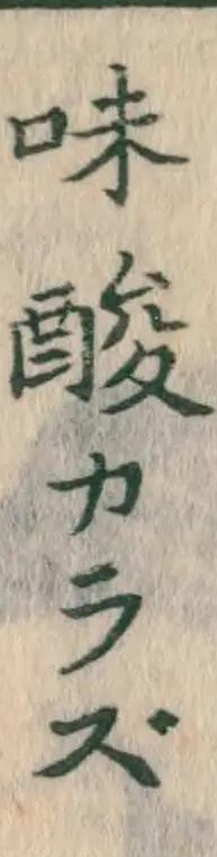味酸カラズ
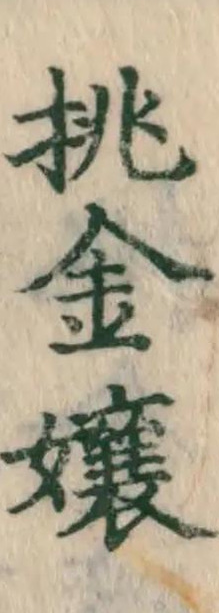桃金嬢
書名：花彙 草部4巻木部4巻. [2]
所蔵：国立国会図書館 National Diet Library, JAPAN
